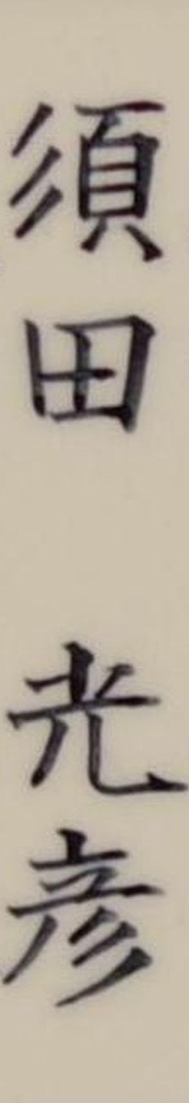須田光彦
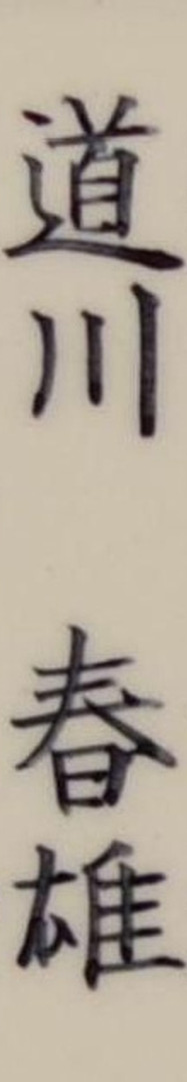道川春雄
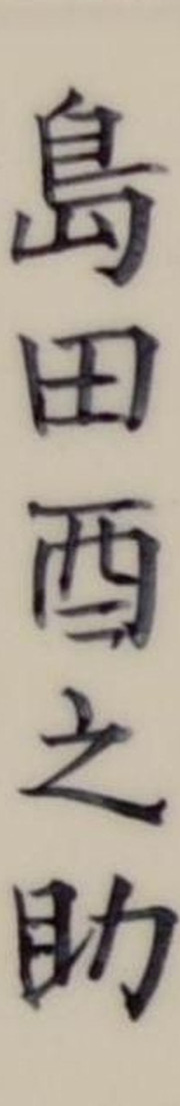島田酉之助
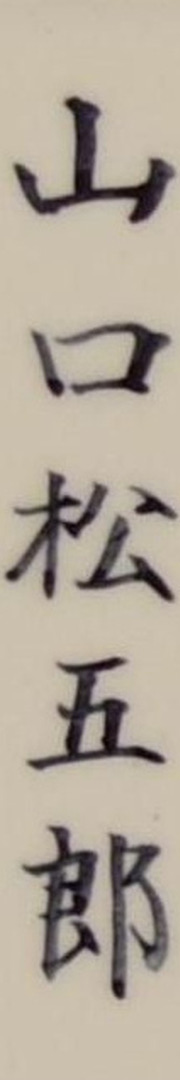山口松五郎
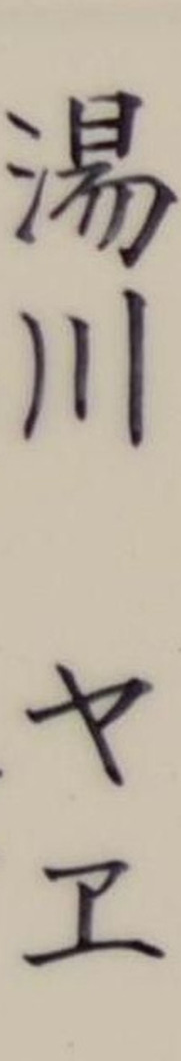湯川ヤエ
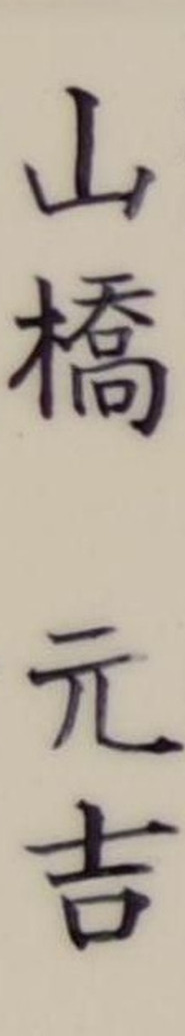山橋元吉
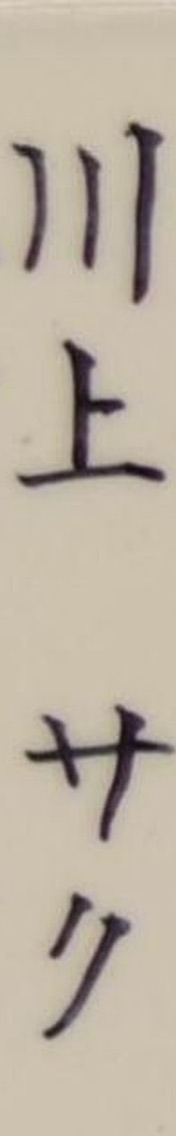川上サク
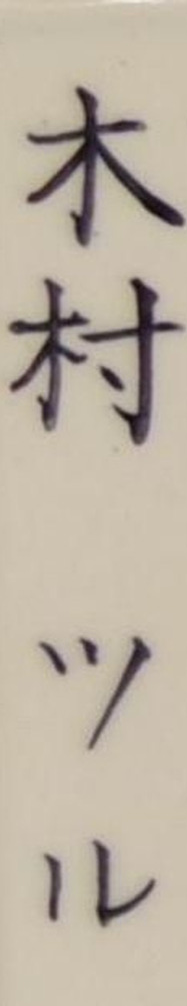木村ツル

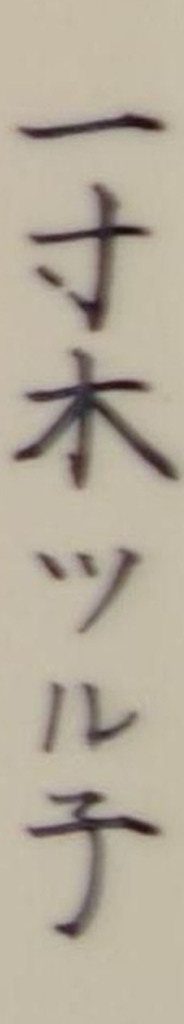一寸木ツル子
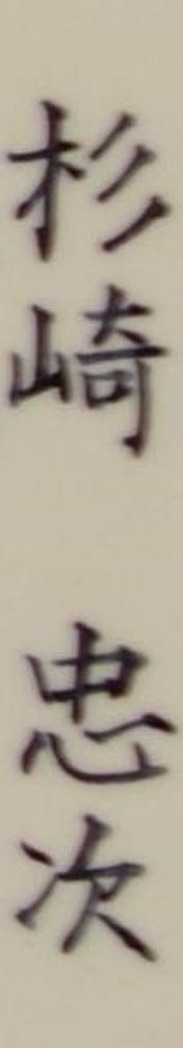杉崎忠次
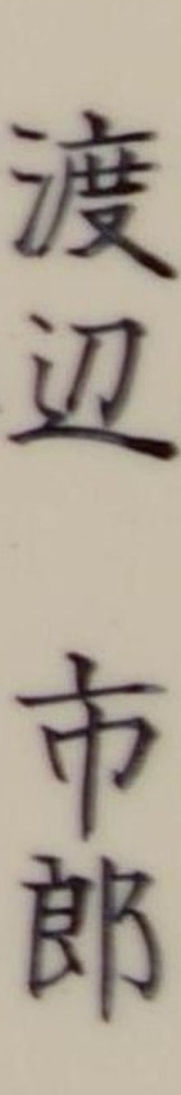渡辺市郎
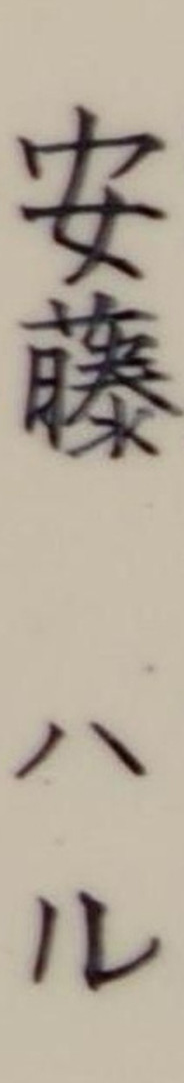安藤ハル
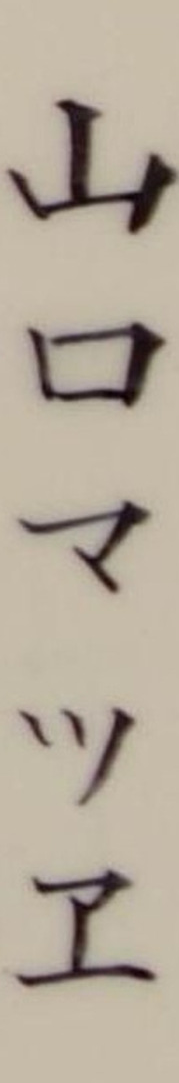山口マツエ
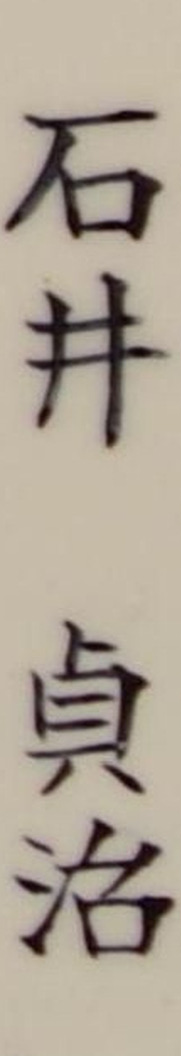石井貞治
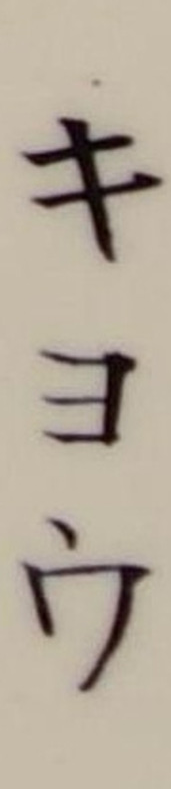キヨウ
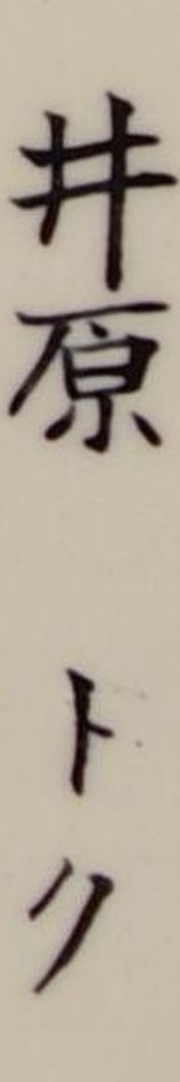井原トク
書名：M~S
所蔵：高野山金剛峯寺
